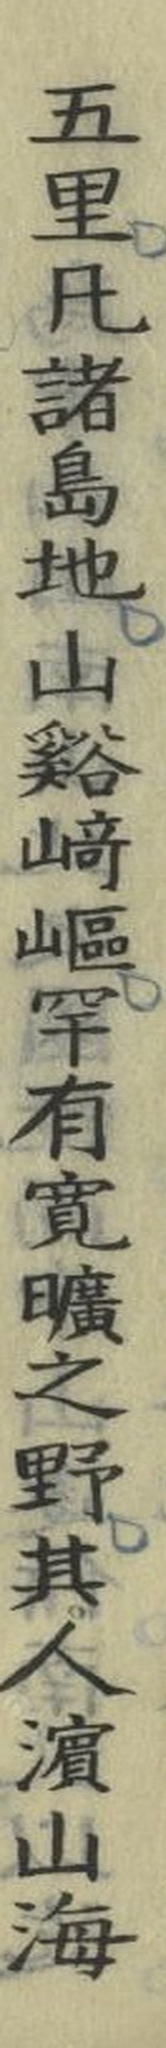五里。凡諸島地。山谿﨑嶇。罕有寛曠之野。其人濵山海
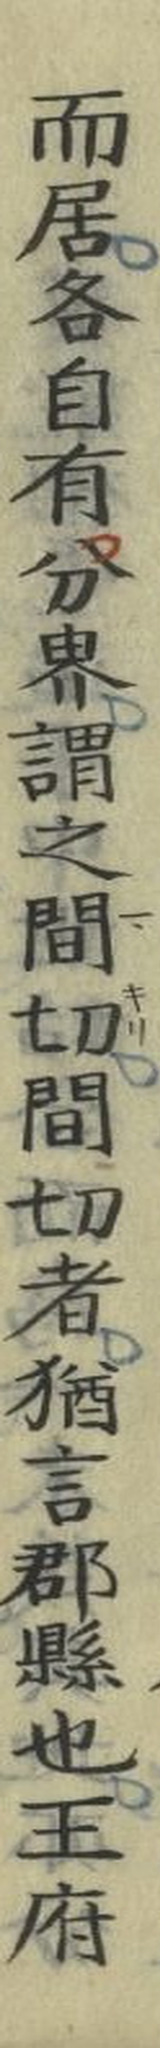而居。各自有分界。謂之間切。間切者。猶言郡縣也。王府
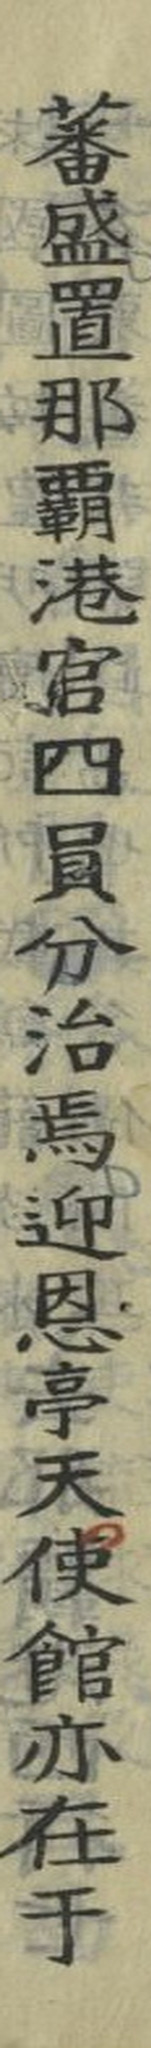蕃盛。置那覇港官四員分治焉。迎恩亭天使館亦在于
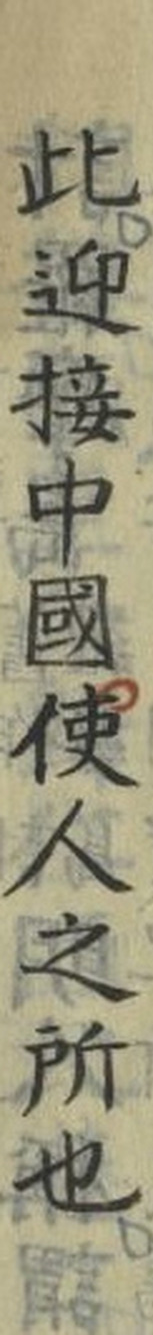此。迎接中國使人之所也。

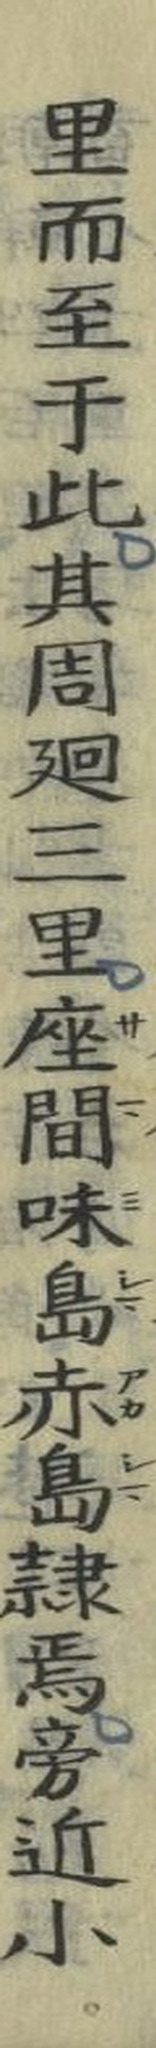里而至于此。其周廻三里。座間味島赤島隷焉。旁近小
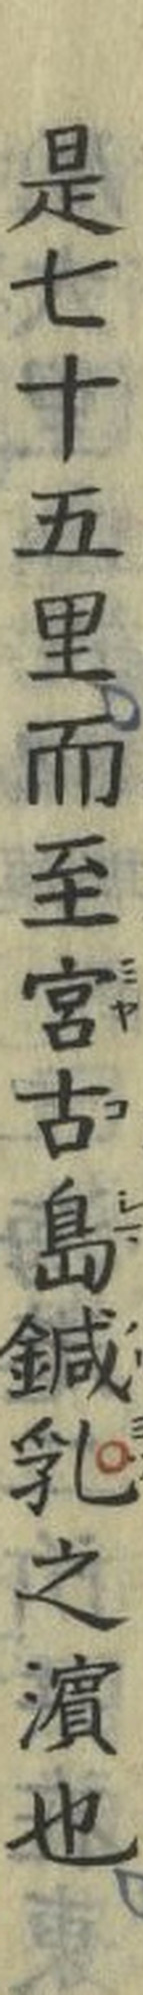是七十五里。而至宮古島鍼乳之濵也。
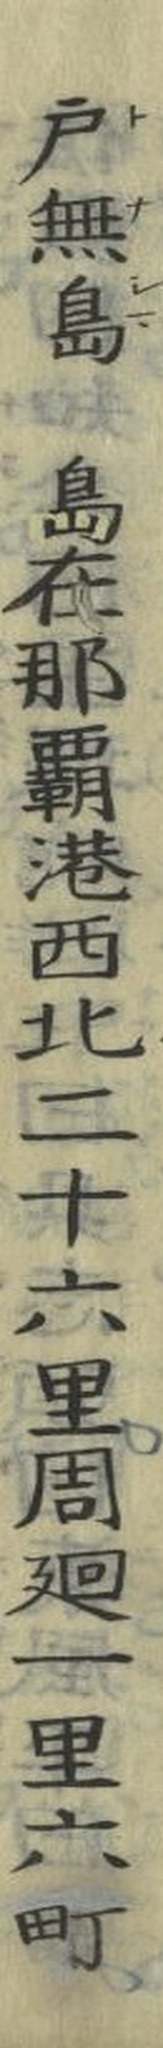戸無島島在那覇港西北二十六里。周廻一里六町。
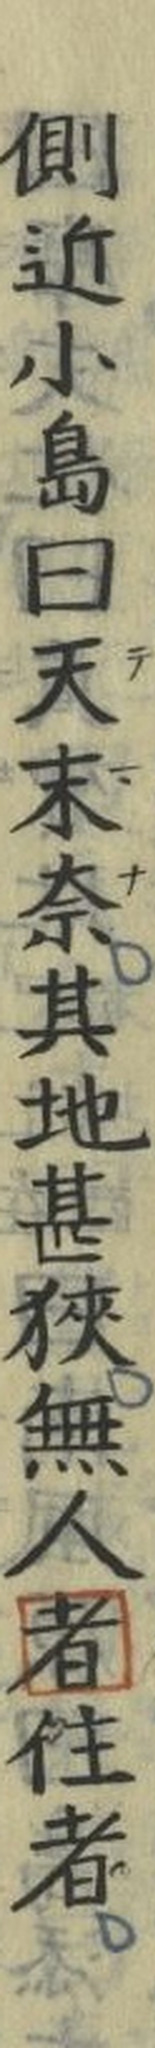側近小島曰天末奈。其地甚狹。無人者住者。
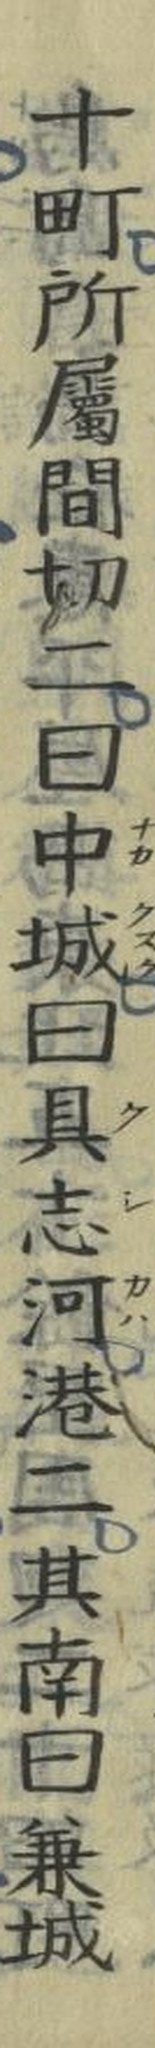十町。所屬間切二。曰中城。曰具志河港二。其南曰兼城
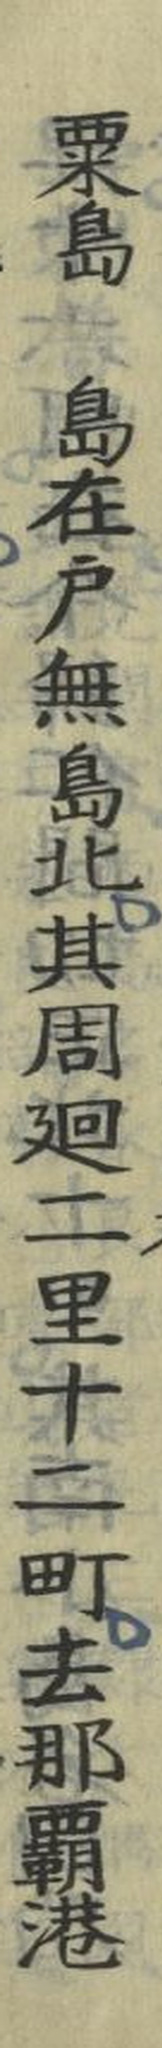粟島島在戸無島北。其周廻二里十二町。去那覇港
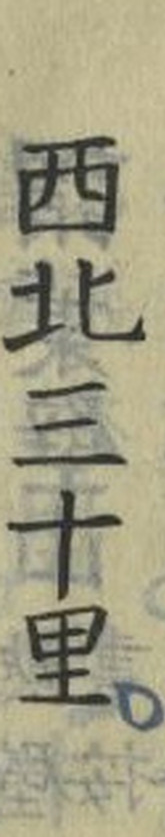西北三十里。

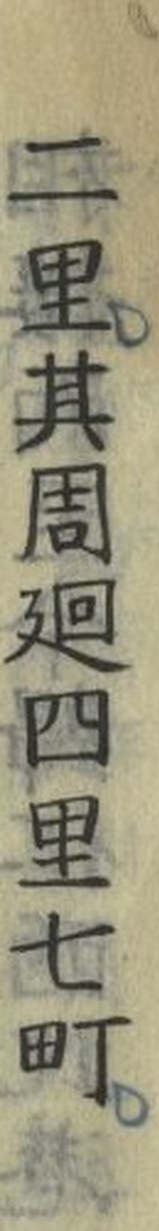二里。其周廻四里七町。
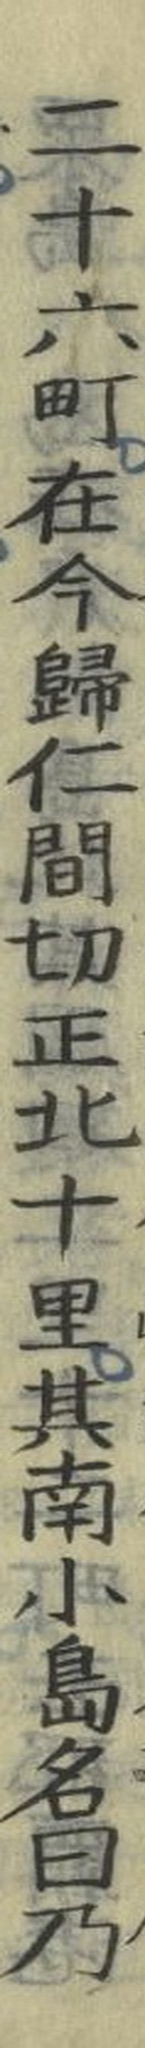二十六町。在今歸仁間切正北十里。其南小島名曰乃
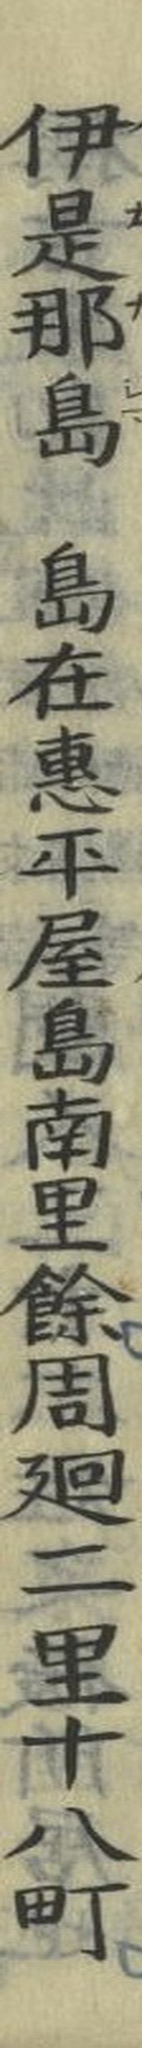伊是那島島在惠平屋島南里餘。周廻二里十八町。
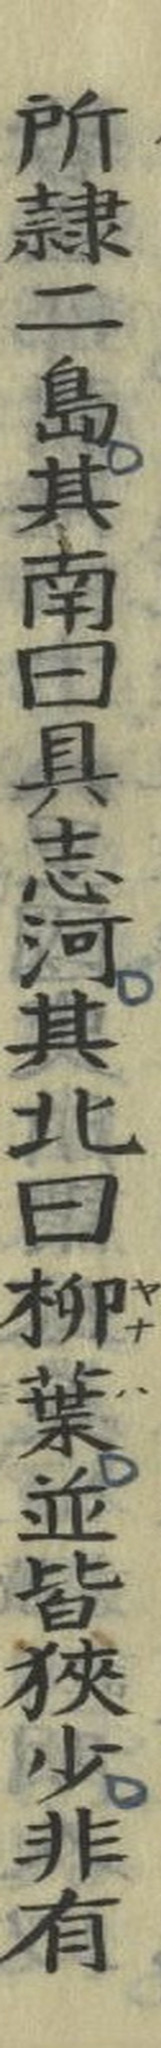所隷二島。其南曰具志河。其北曰柳葉。並皆狹小。非有
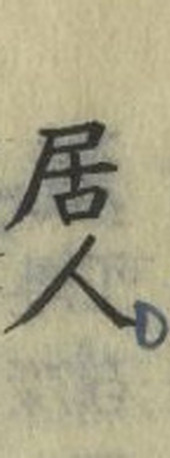居人。
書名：南島志
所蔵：University of the Ryukyus Library
